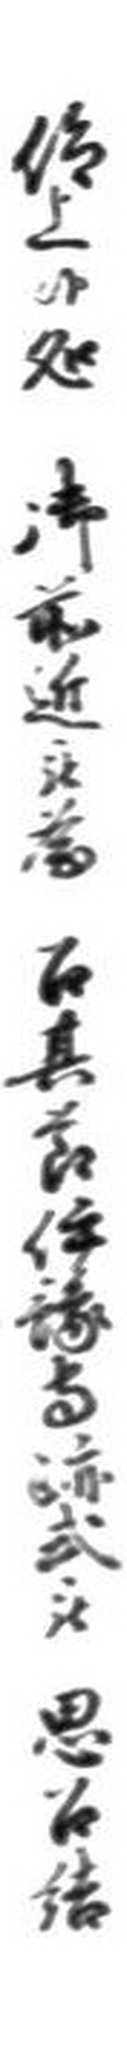仰上候処御前近被為召其節伊予守跡式被思召結
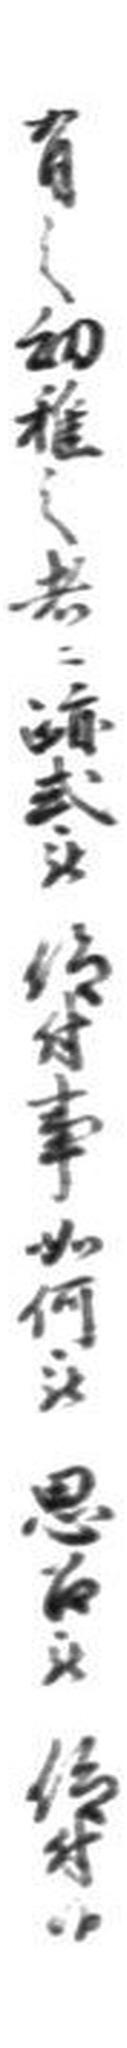有之幼稚之者ニ跡式被仰付事如何被思召被仰付候
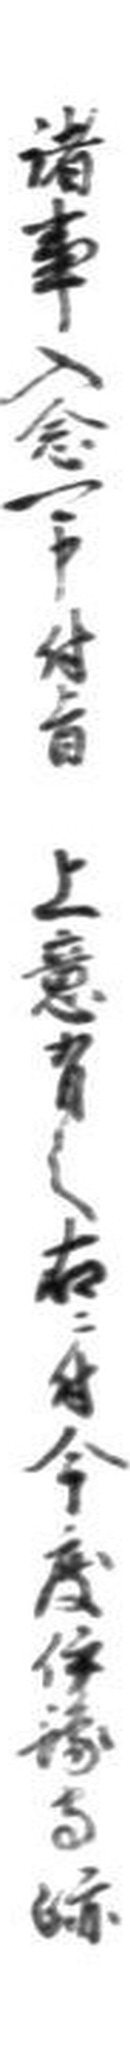諸事入念可申付旨上意有之右ニ付今度伊予守跡
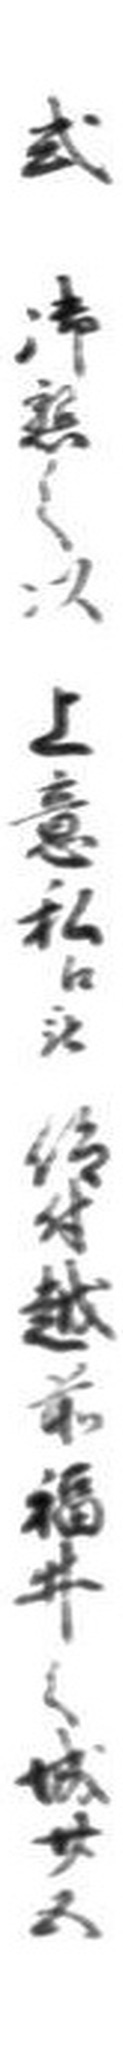式御懇之以上意私江被仰付越前福井之城廿五
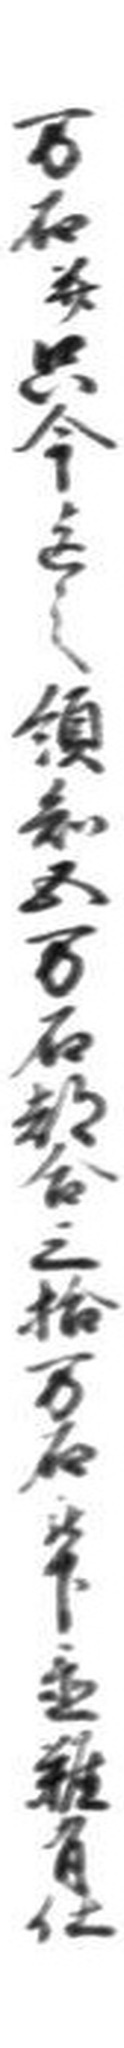万石并只今迄之領知五万石都合三拾万石被下置難有仕
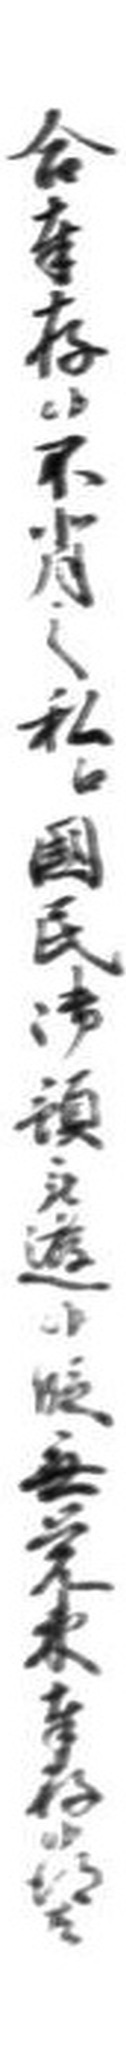合奉存候不肖之私江国民御預被遊候段無覚束奉存候得共
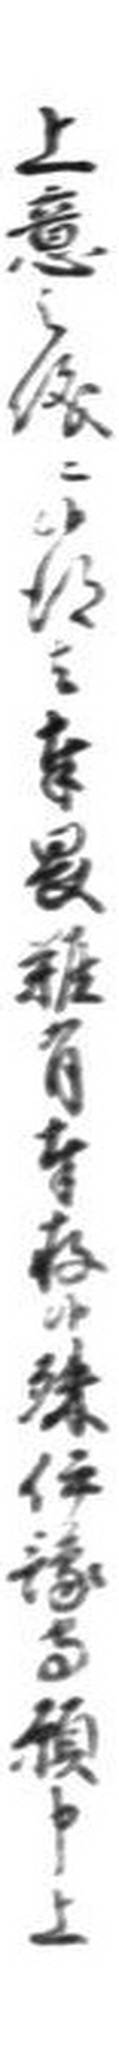上意之儀ニ候得者奉畏難有奉存候殊伊予守願申上

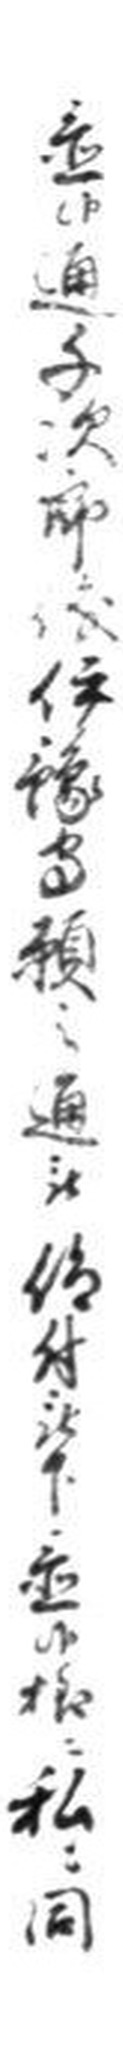置候通千次郎儀伊予守願之通被仰付被下置候様ニ私ニ同
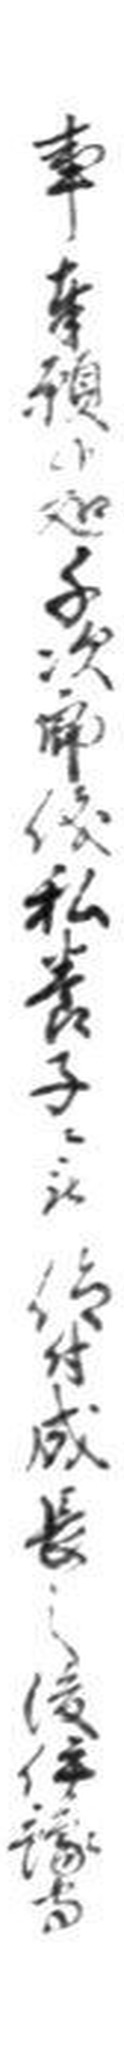事奉願候処千次郎儀私養子ニ被仰付成長之後伊予守
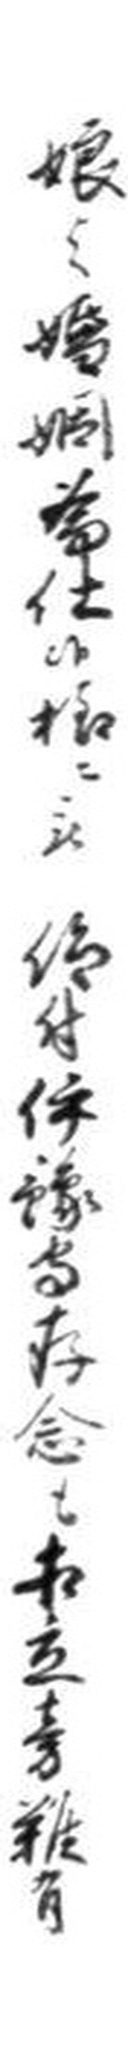娘与婚姻為仕候様ニ被仰付伊予守存念も相立旁難有
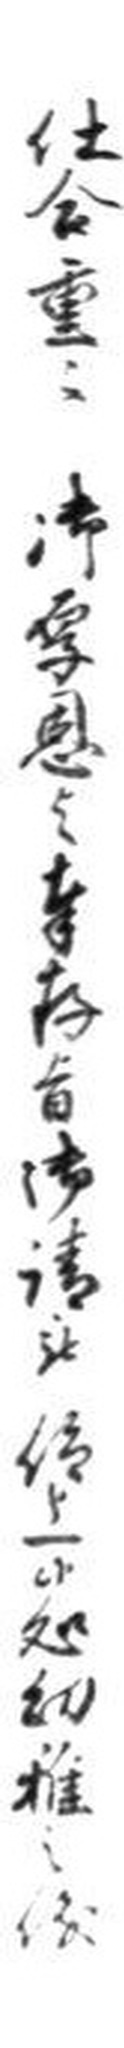仕合重々御厚恩与奉存旨御請被仰上候処幼稚之儀
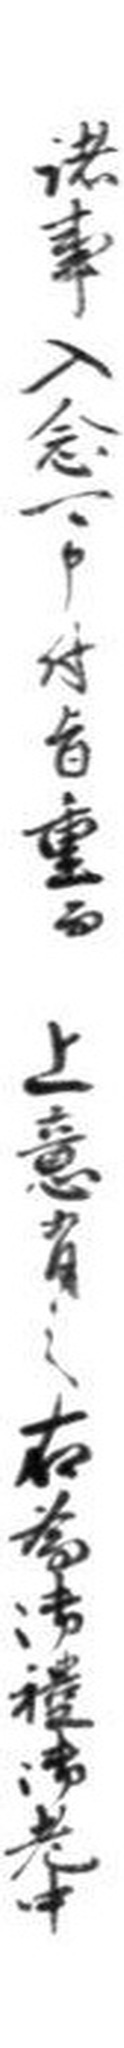諸事入念可申付旨重而上意有之右為御礼御老中
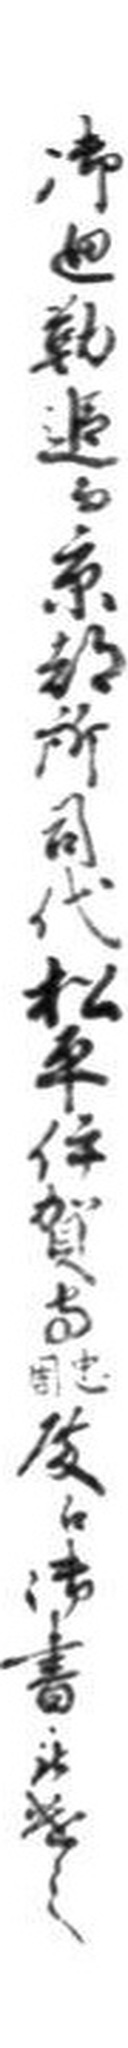御廻勤追而京都所司代松平伊賀守忠周殿江御書付被遣之
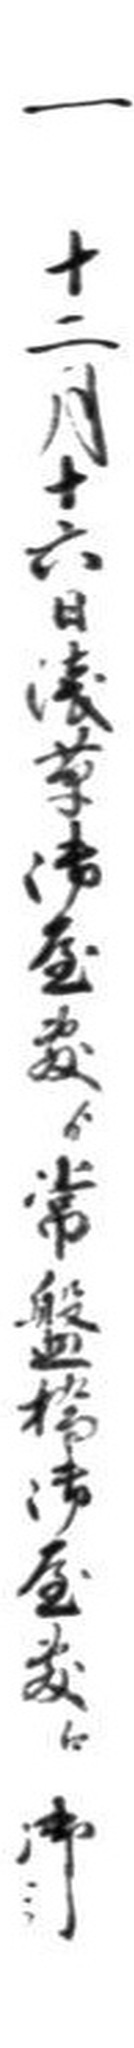一十二月十六日浅草御屋敷ゟ常盤橋御屋敷江御引
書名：家譜 三十五 宗昌公 従享保六年到同七年
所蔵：福井県文書館 Fukui Prefectural Archives
